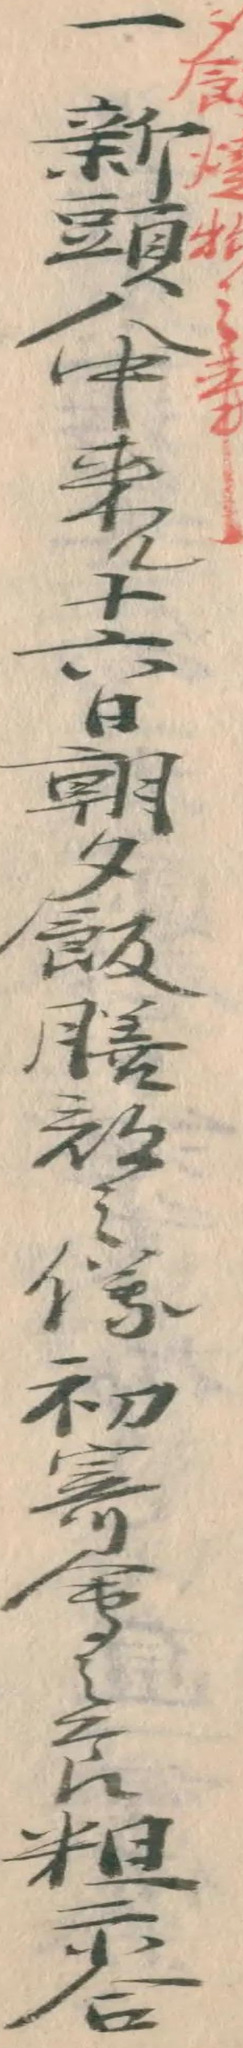一新頭人中来ル十六日朝夕飯膳部之儀初寄會之節粗示合
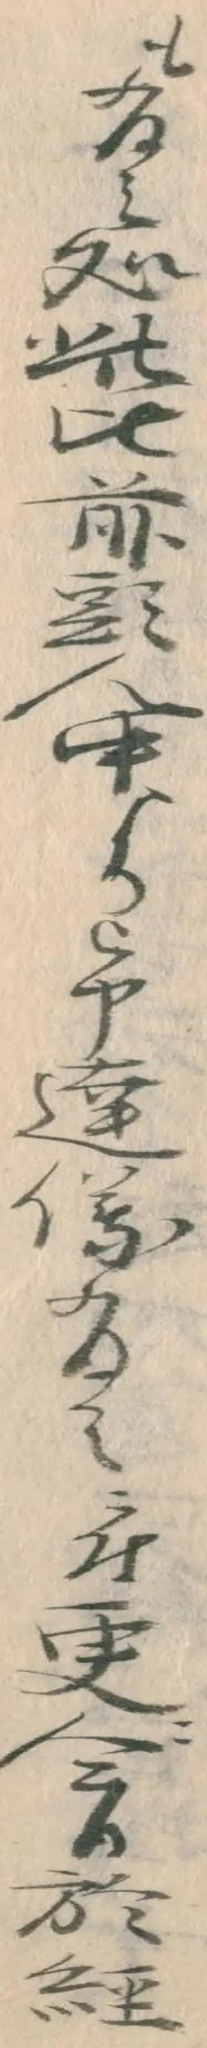も有之処此比前頭人中より被申達儀有之ニ付更ニ今日於経
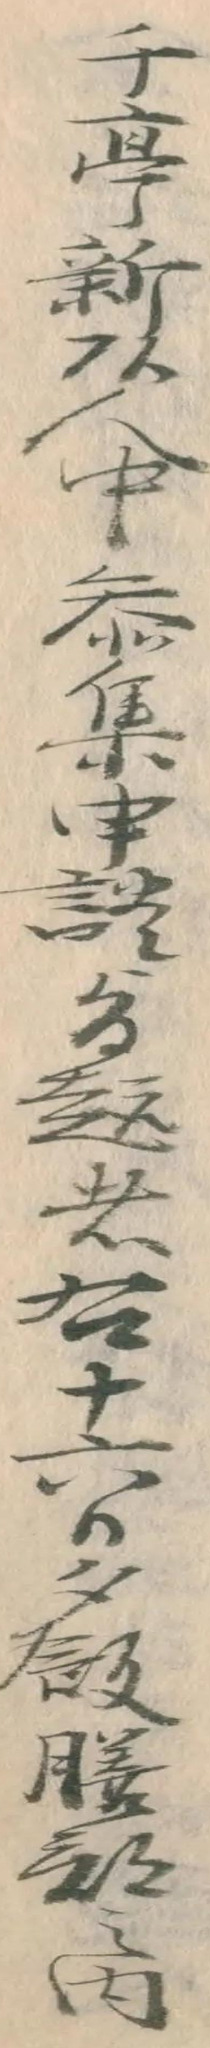千亭新頭人中参集申談旨趣者右十六日夕飯膳部之内
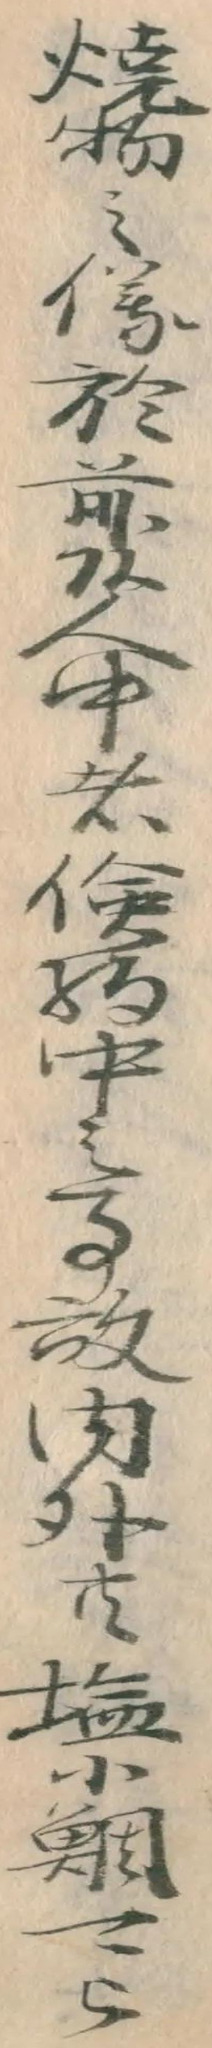焼物之儀於前頭人中者倹約中之事故内外共塩小鯛可被

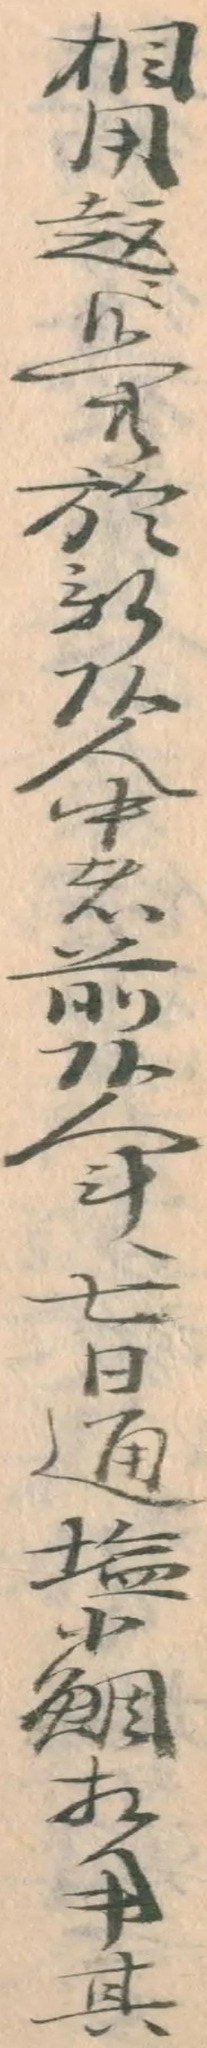相用趣ニ候へ共於新頭人中者前頭人斗へ七日通塩小鯛相用其
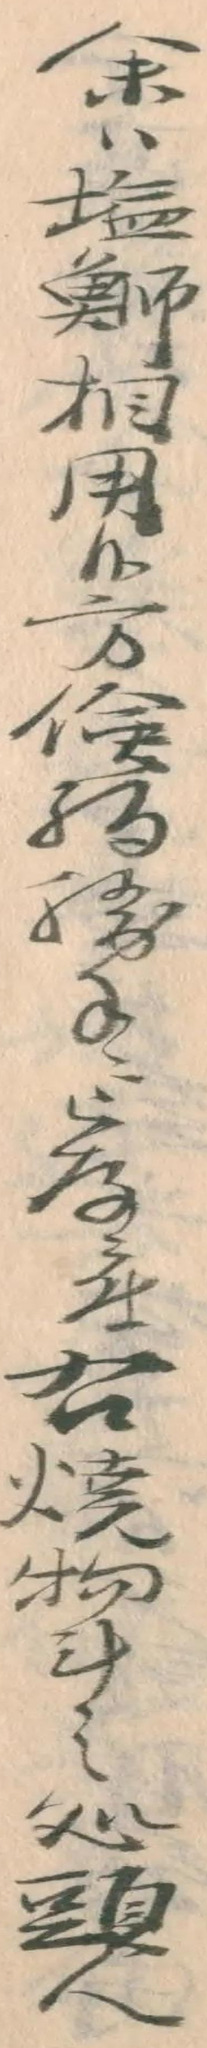余ハ塩鰤相用候方倹約勝手ニ被為ニ付右焼物斗之処頭人
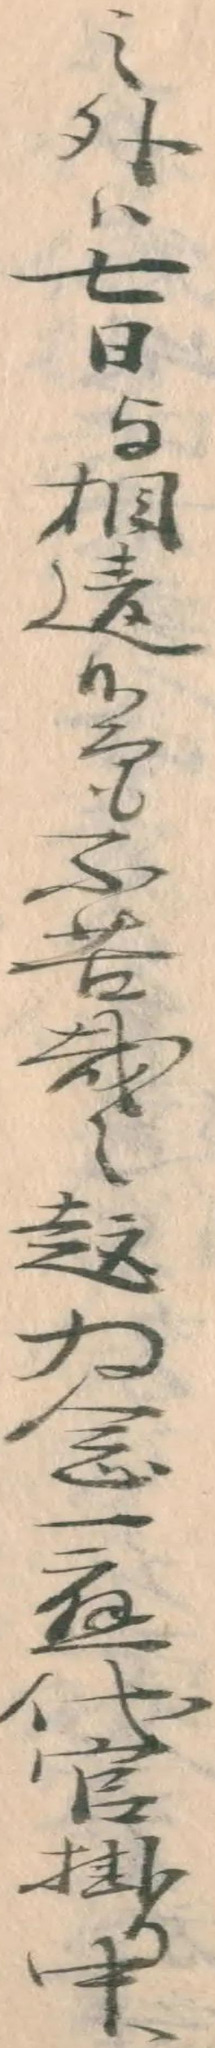之外ハ七日と相違候而も不苦哉之趣為念一應代官掛り中へ
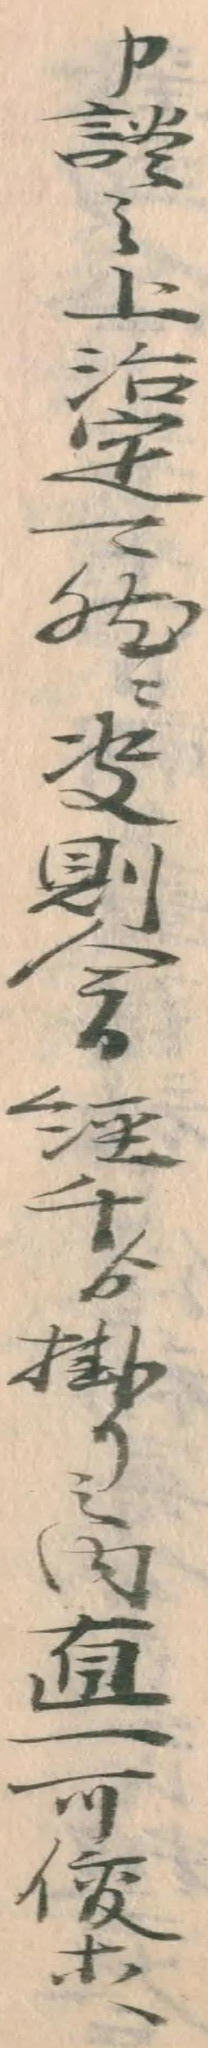申談之上治定可然ニ決則今日経千ゟ掛り之内直一可俊等へ
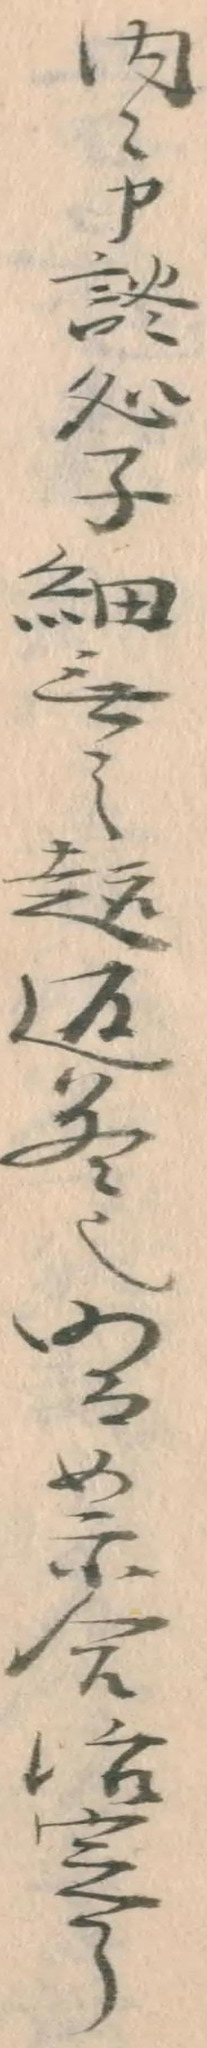内々申談処子細無之趣返答也仍而如示合治定了
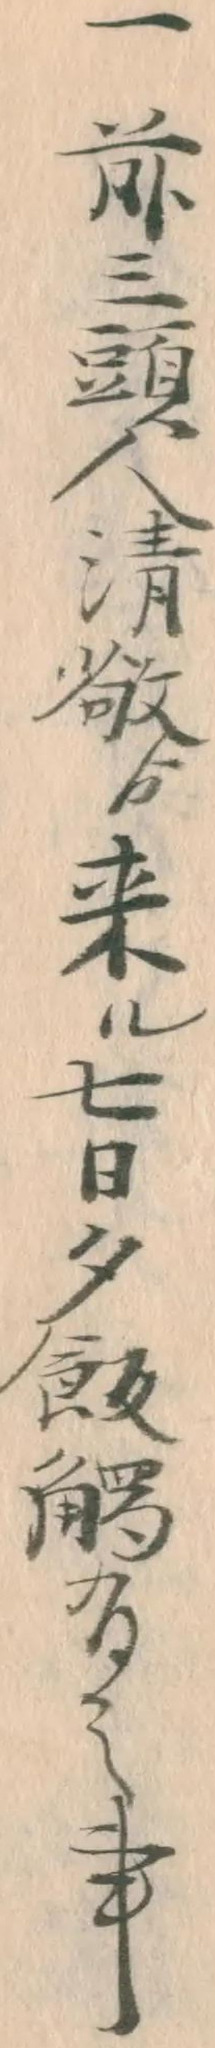一前三頭人清敬ゟ来ル七日夕飯触有之事
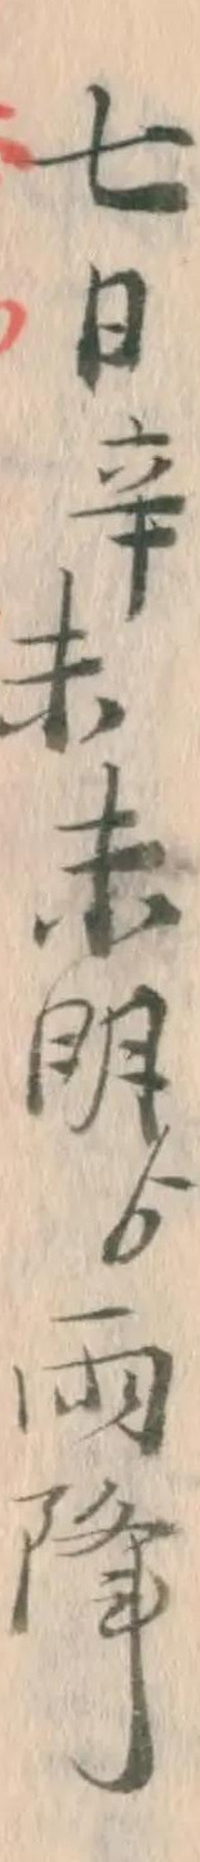七日辛未未明ゟ雨降
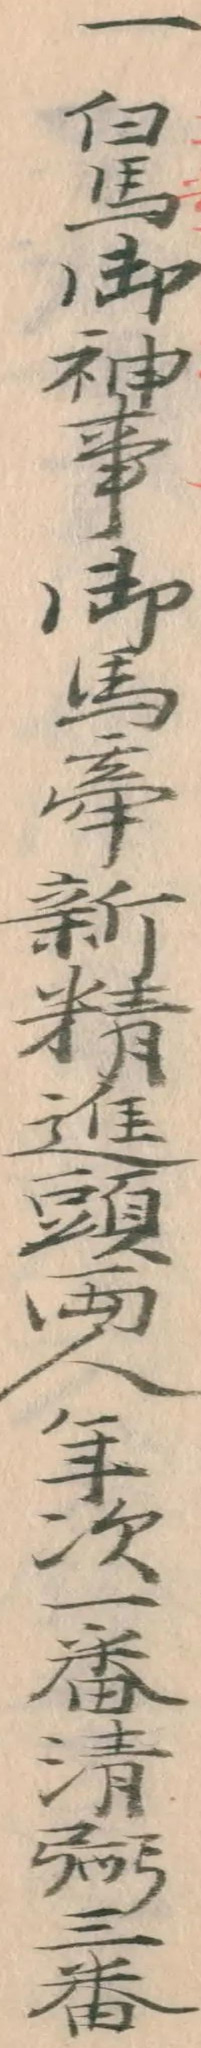一白馬御神事御馬牽新精進頭両人年次一番清弼三番
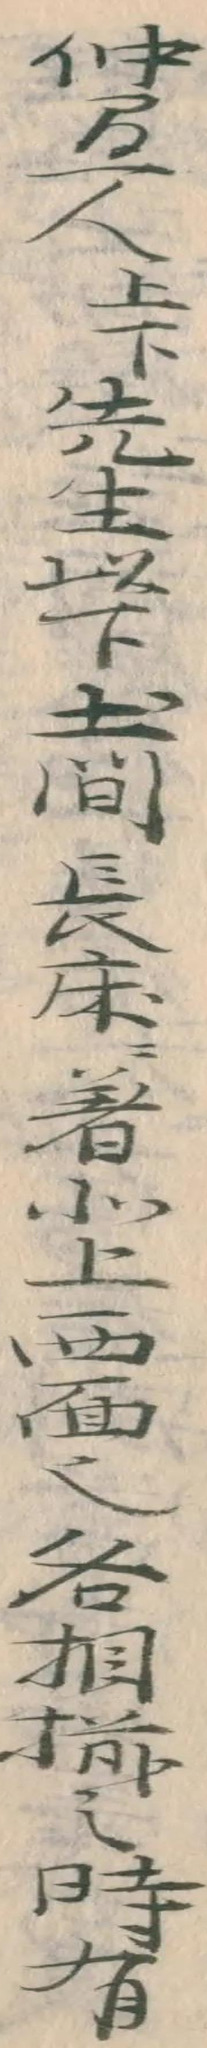仲間一人上下先生以下土間長床ニ着北上西面也各相揃之時有
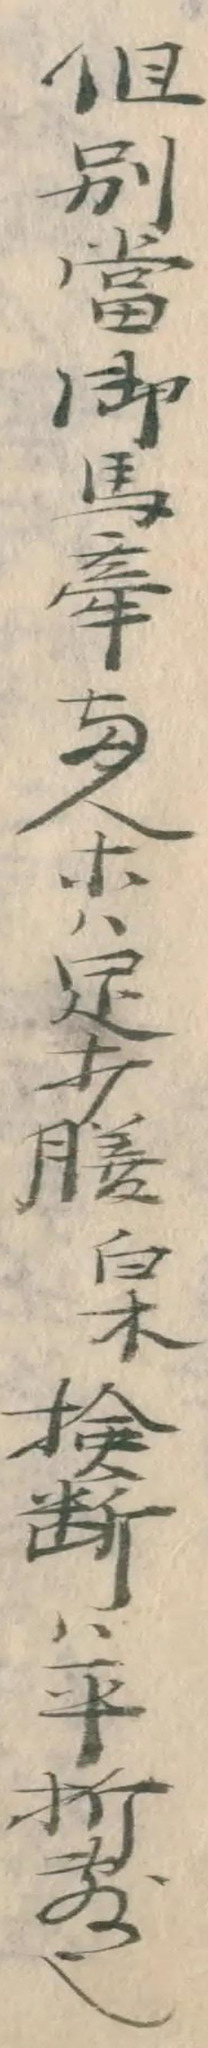但別當御馬牽両人等ハ足打膳白木検断ハ平折敷也

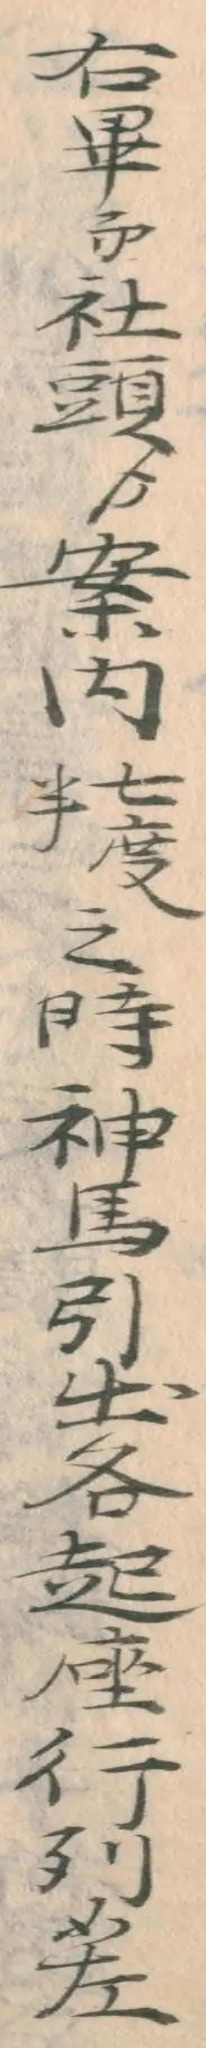右畢而社頭ゟ案内七度半之時神馬引出各起座行列如左
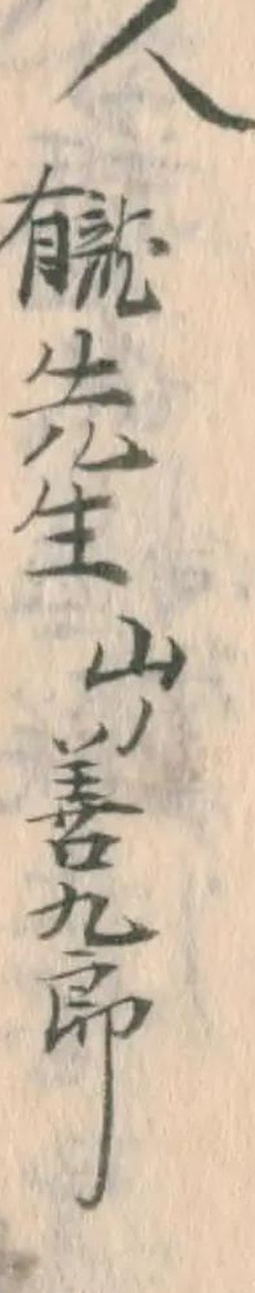龓先生山ノ善九郎
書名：賀茂社記録. 第72冊
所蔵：国立国会図書館 National Diet Library, JAPAN
